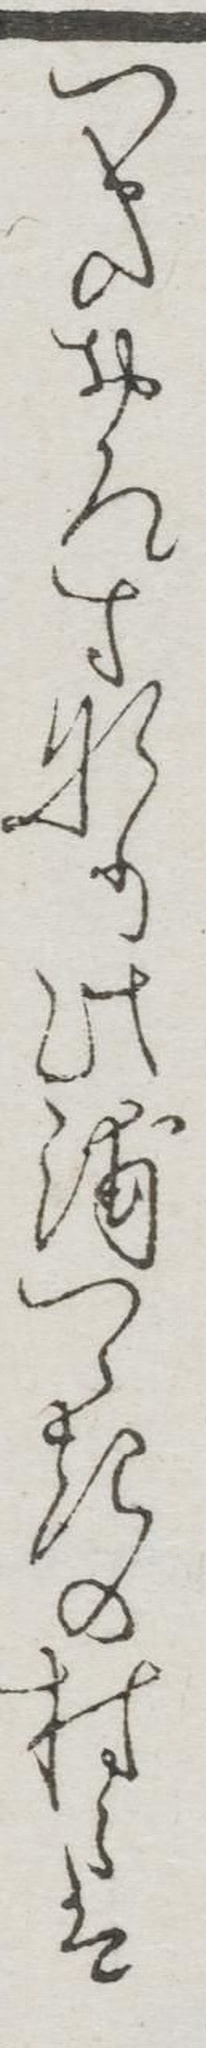つきおろすなり此浦つゝきの村々は
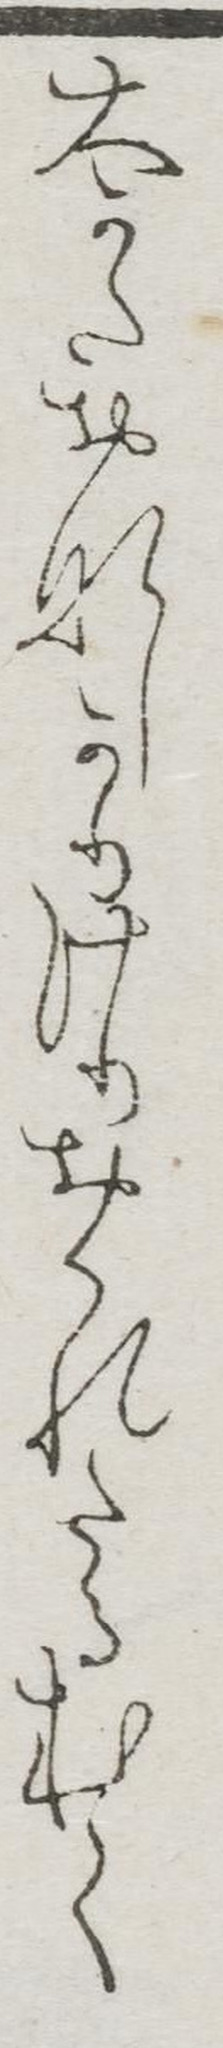大かたおなしかりけりおくれたるむく
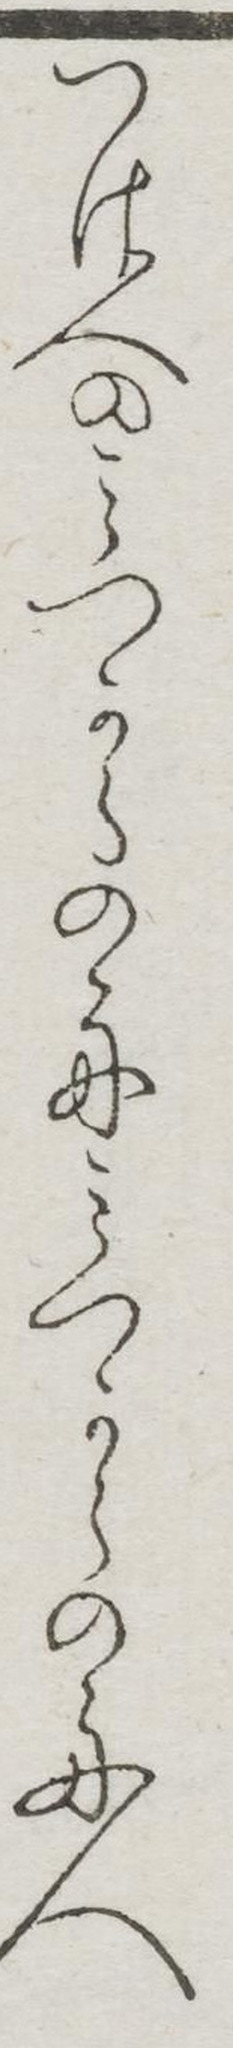つけ人のみつからの舟みつからの舟人笧台
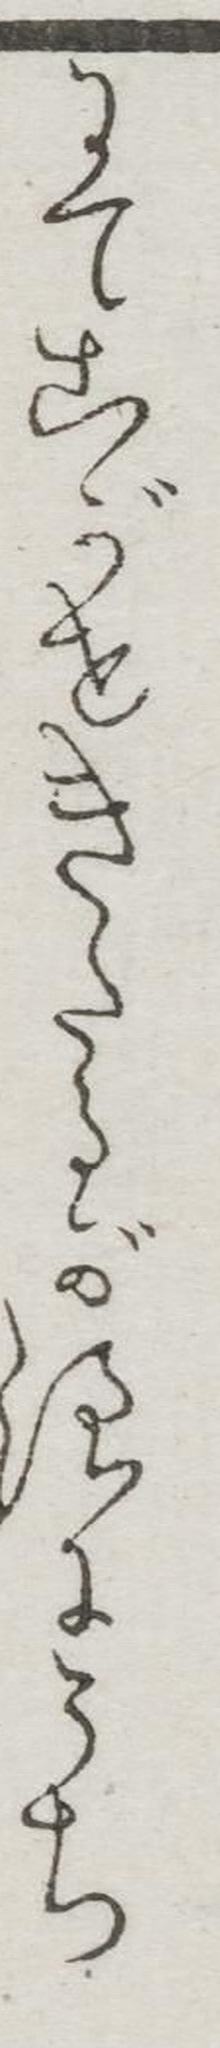にてこがせきたるが浪にうち
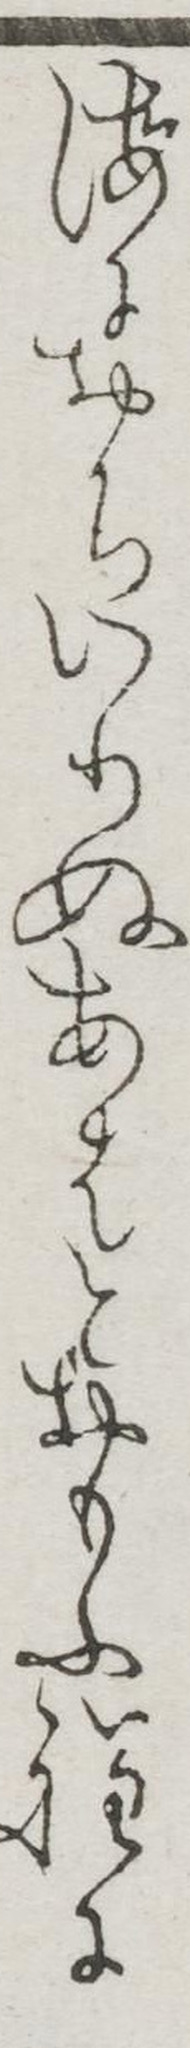海におちいりぬあはとおもふ程に
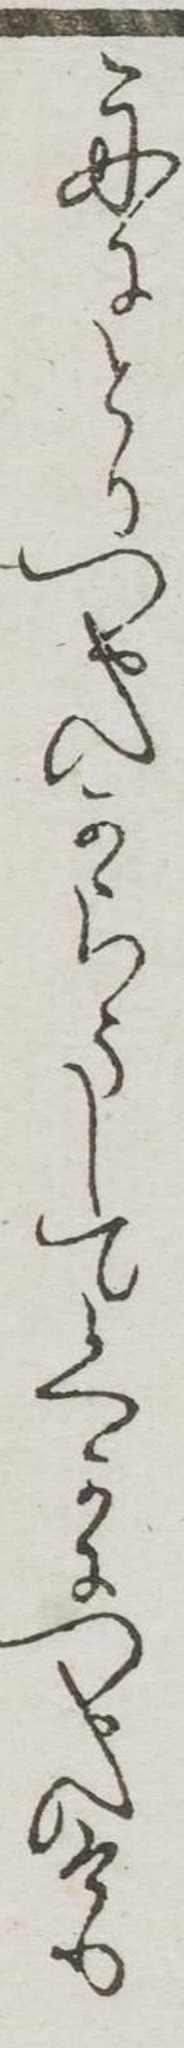舟にとりつきからうしてくかにつきけり

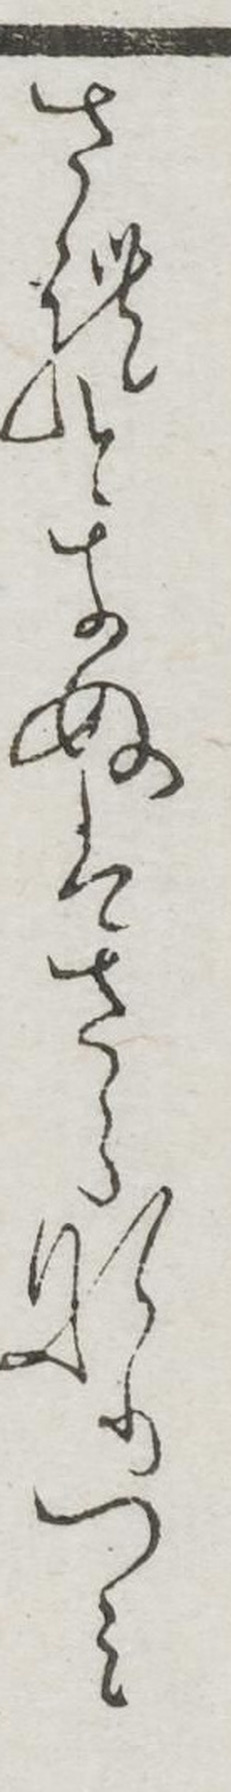されときぬはさらなりつみ
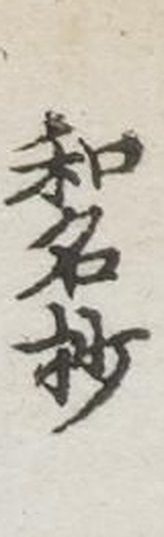和名抄
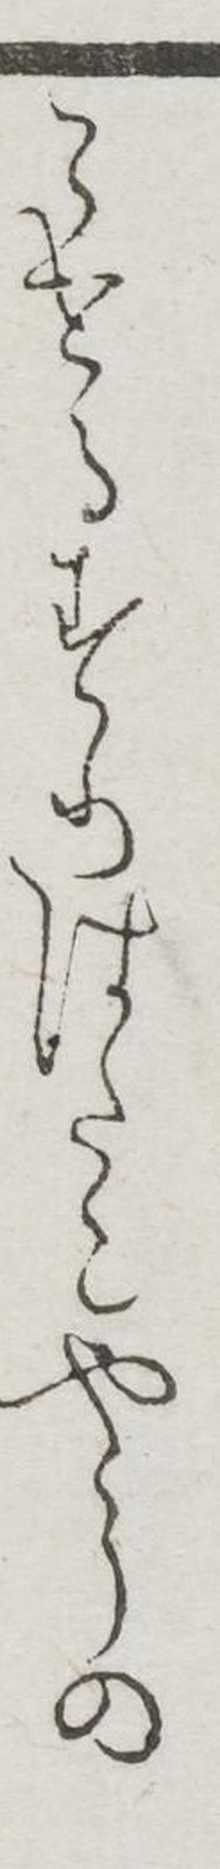こせるすりはたこやうの
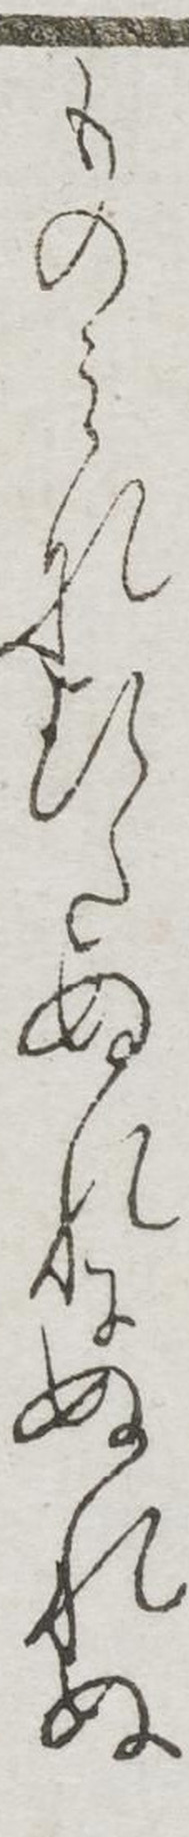ものみなひたぬれにぬれぬ
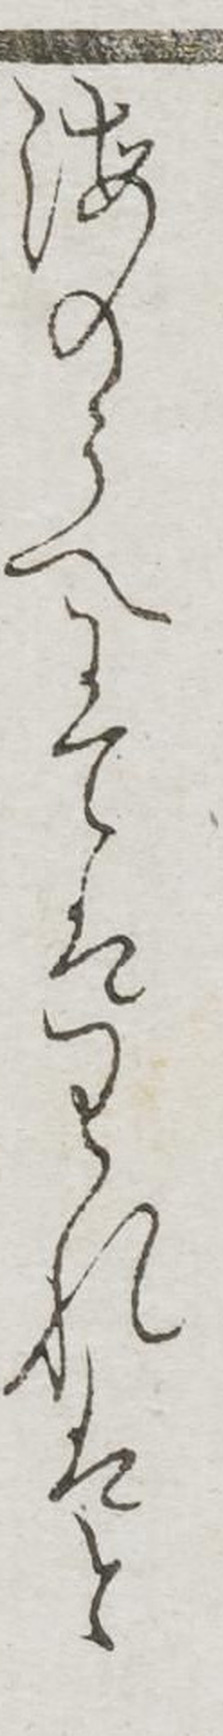海のうへにてはわれはと
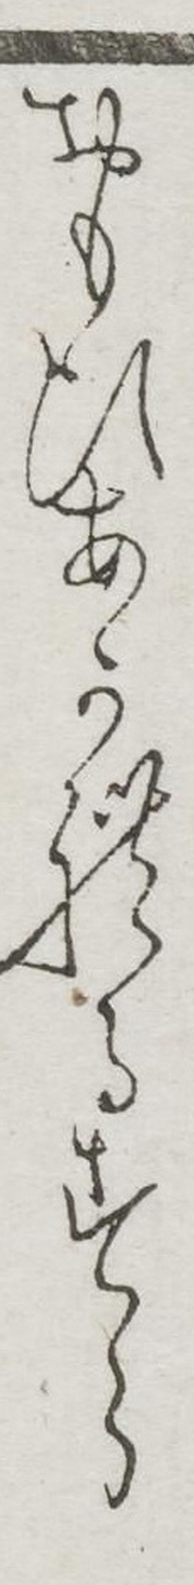おもひあかれるすら
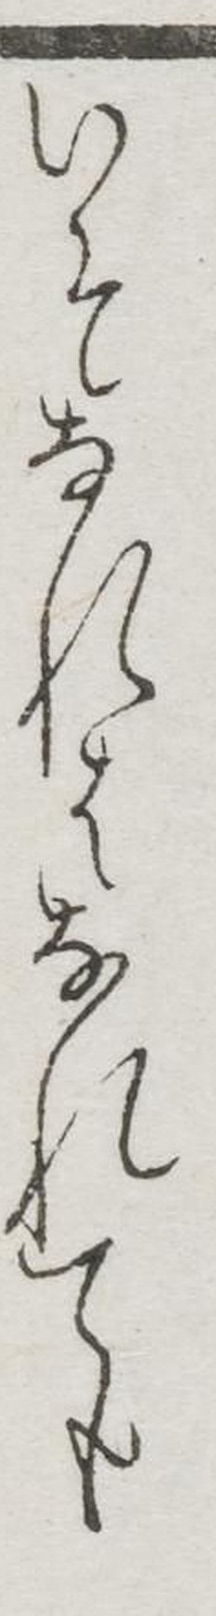いそなれはなれても
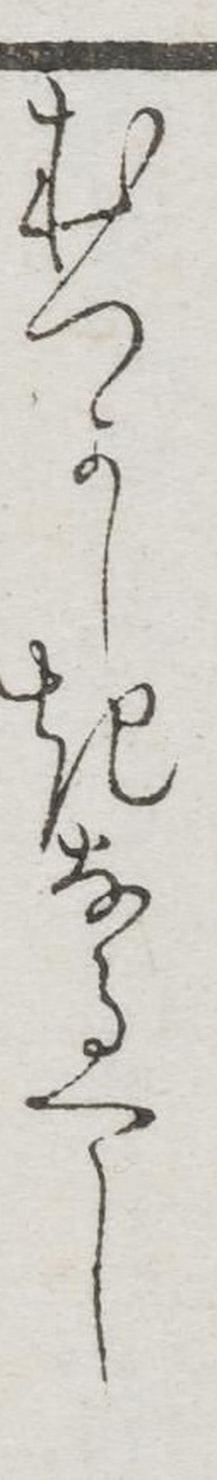むつかしきなるへし
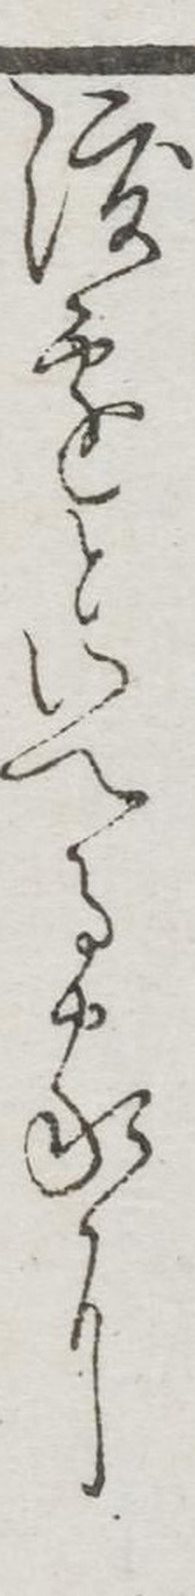渡邊といへる家に
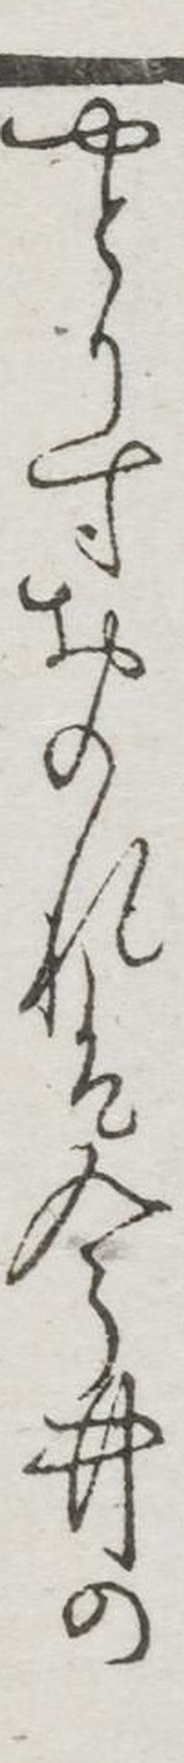やとりすおのれは今井の
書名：挿画熱海日記　全
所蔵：東京大学地震研究所図書室 Earthquake Research Institute Library, The University of Tokyo, JAPAN
